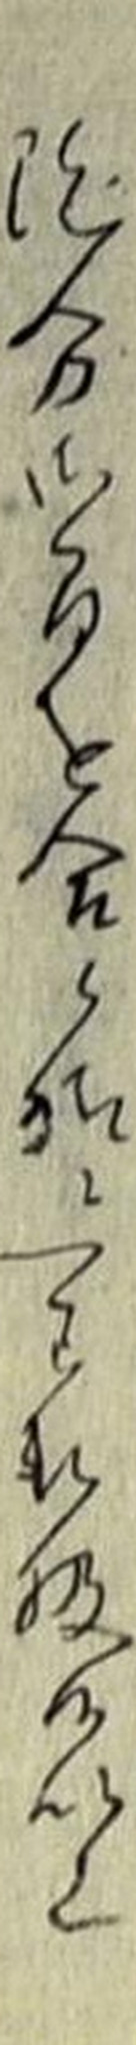随分御間を合候様ニ可被取扱候以上
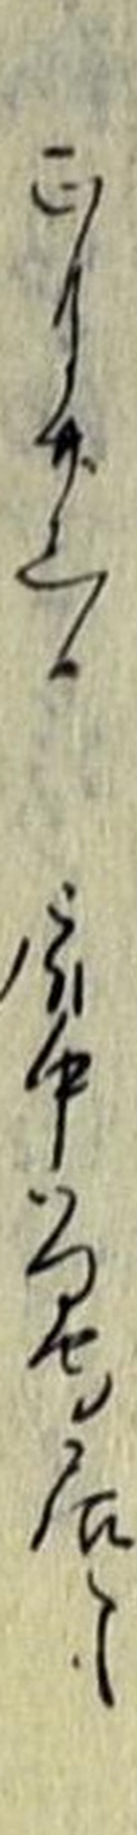正月廿三日府中留守居へも
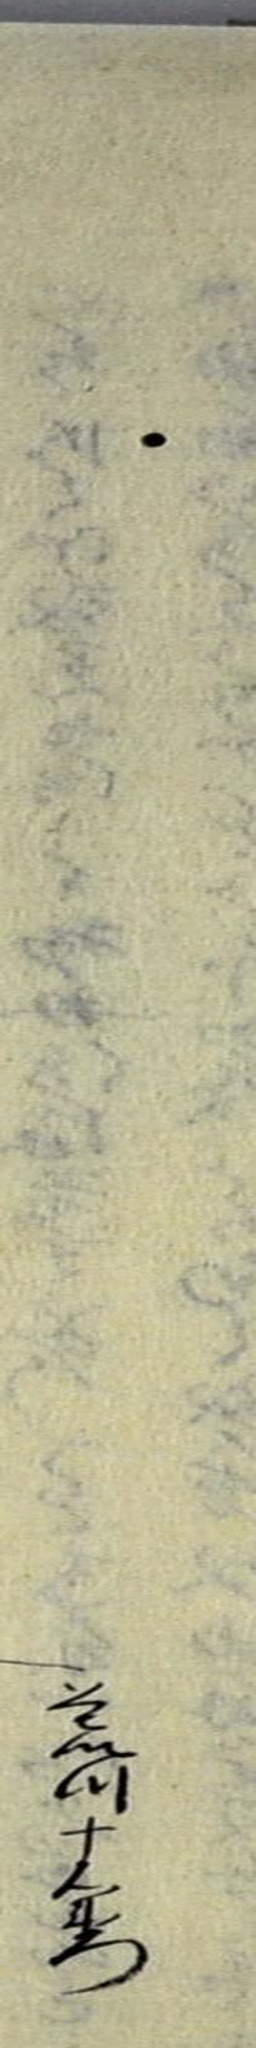荒川十右衛門
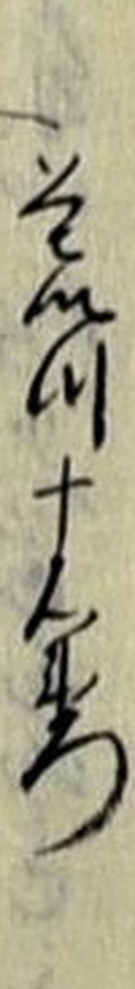荒川十右衛門
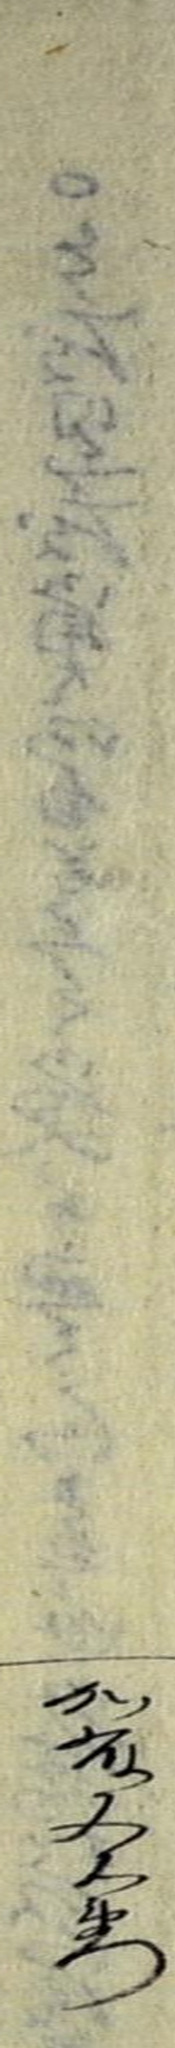加藤又右衛門
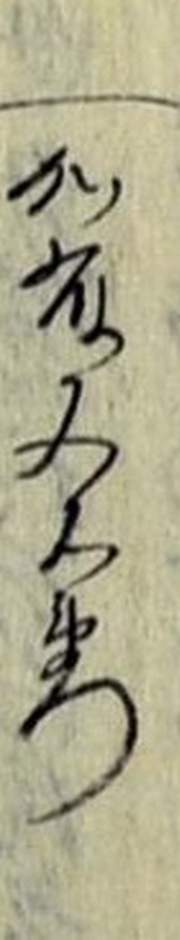加藤又右衛門
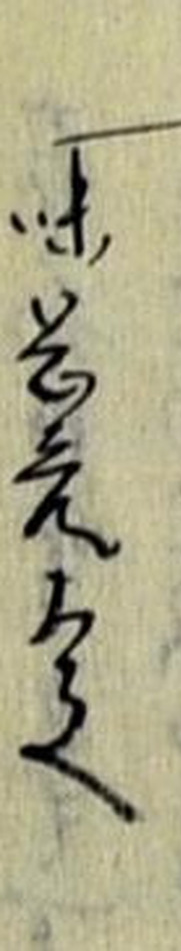味岡彦大夫
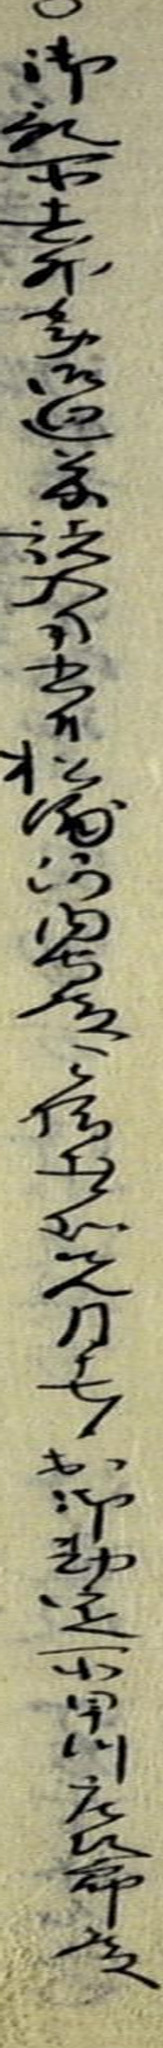〇御預所去卯年御廻米諸入用書付松浦河内守殿へ被指出候処先月十七日於御勘定所早川庄次郎殿
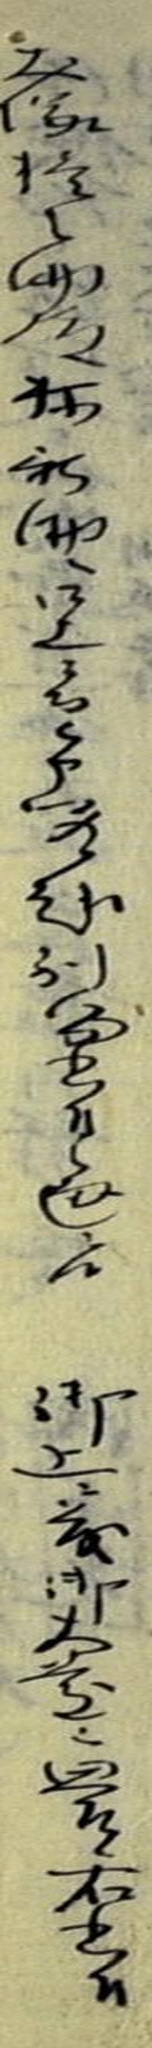犬塚権之助殿林新助へ口上ニ而被申聞候趣別紙書付之通ニ候御上ニ茂御大慶被思召候右書付
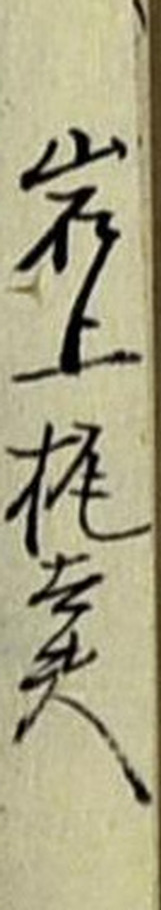岩上梶大夫
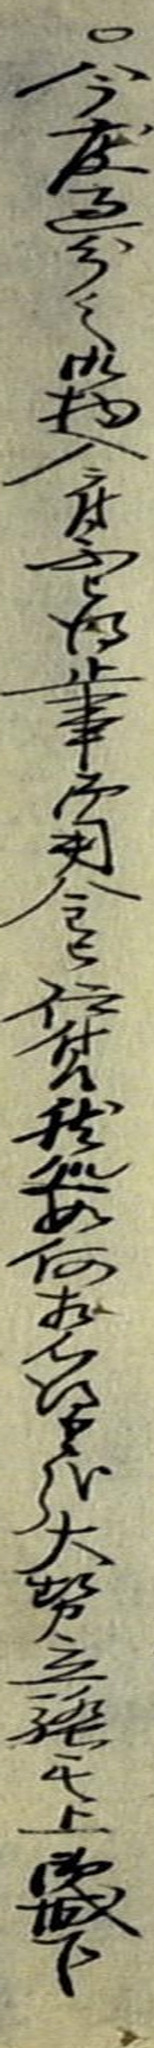〇今度過分之御物入ニ付不被得止事御用金被仰付候然処如何相心得申哉大勢立騒其上御城下
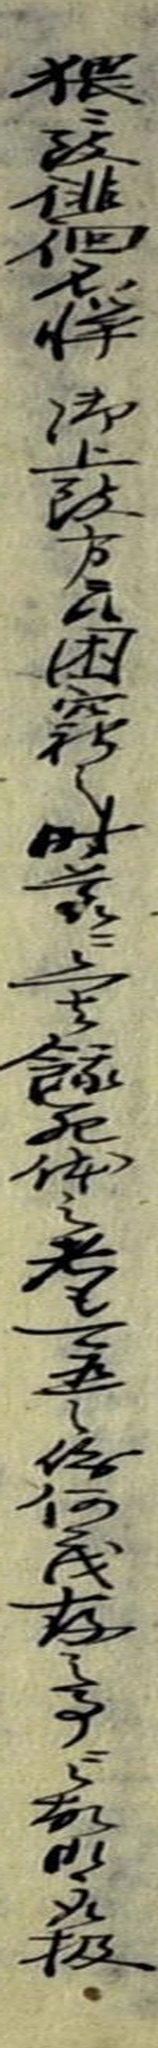猥ニ致徘徊不憚御上致方ニ候困窮之時節ニ候ヘ者餓死体之者も可有之儀何茂存之事ニ候故御取扱
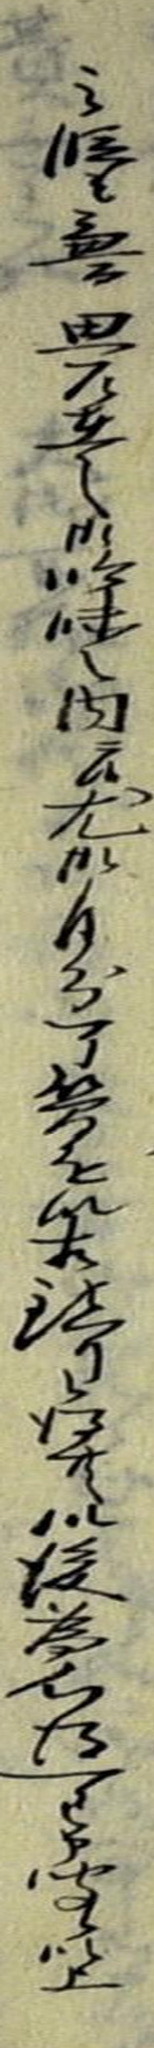之段も兼而思召在之御吟味之内ニ候尤御自分了簡を以相鎮り候得共以後為心得可被申聞候以上
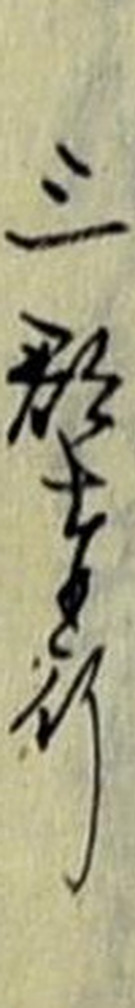三郡奉行
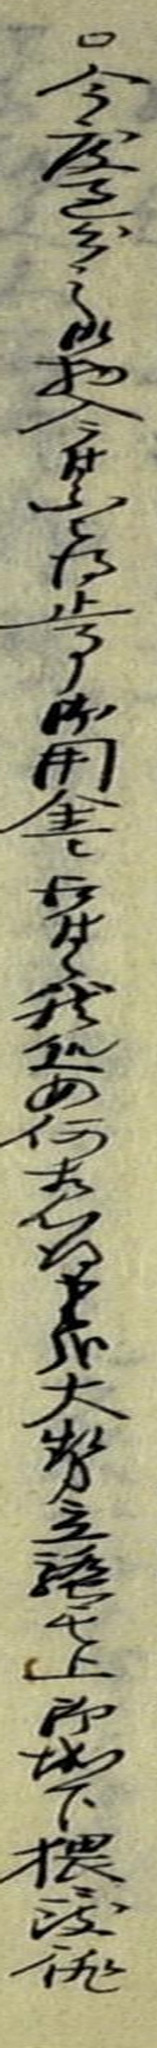〇今度過分之御物入ニ付不被得止事御用金被仰付候然処如何相心得申候哉大勢立騒其上御城下猥ニ致徘
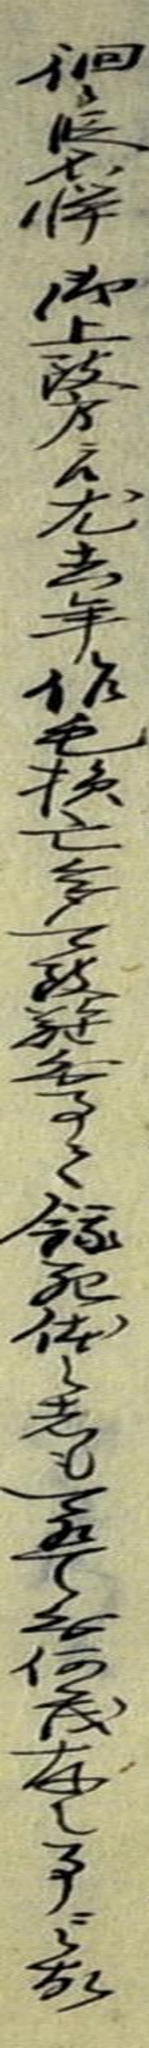徊候段不憚御上致方ニ候尤去年作毛損亡多可致難義事ニ候餓死体之者も可有之義何茂存之事ニ候故
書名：命令之部 一
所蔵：福井県文書館 Fukui Prefectural Archives
